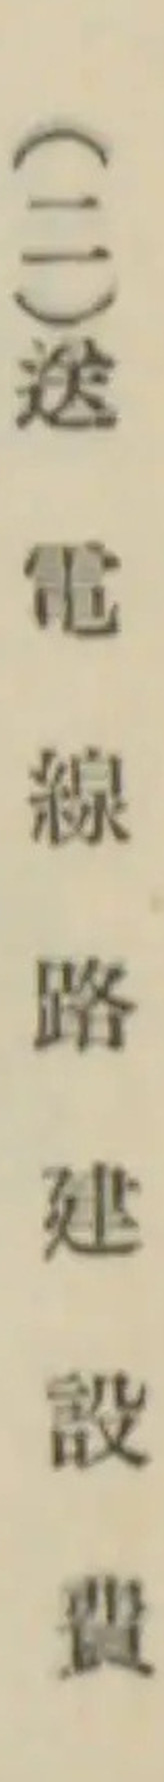(二)送電線路建設費
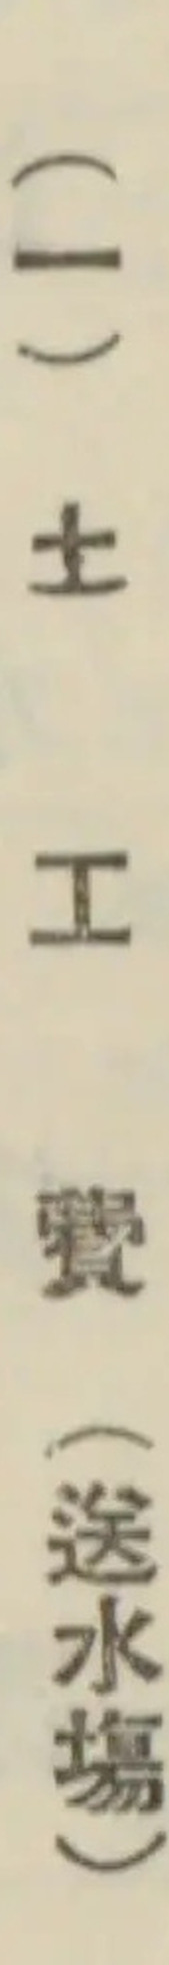(一)土工費(送水場)
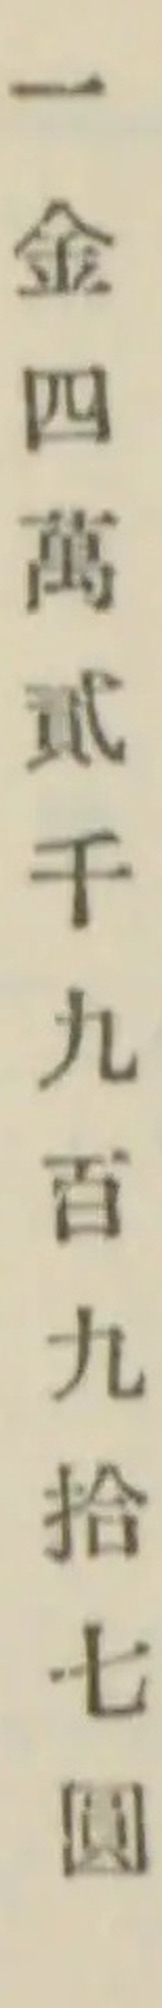一金四萬貳千九百九拾七圓
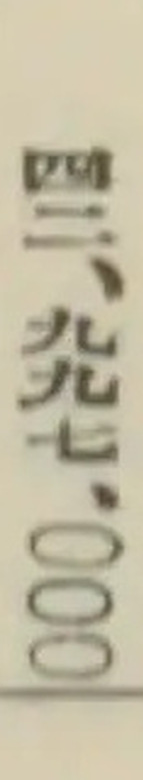計四二、九九七、〇〇〇
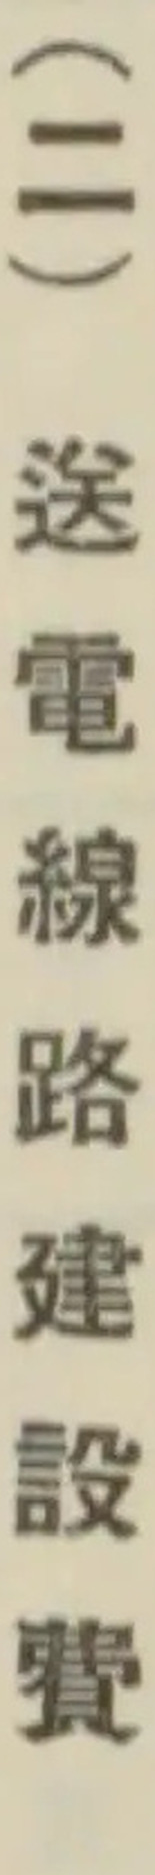(二)送電線路建設費
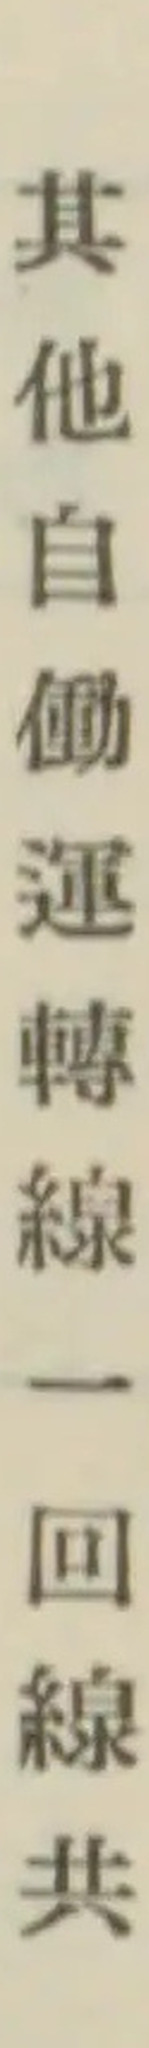其他自働運転一回線共
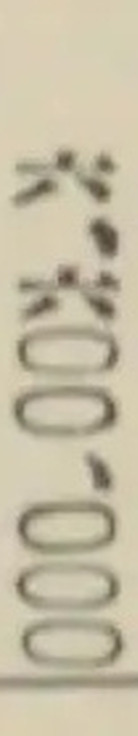水替費八〇〇、〇〇〇
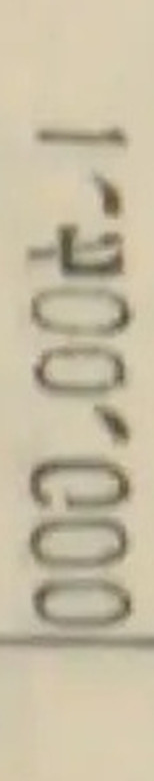木型費七〇〇、〇〇〇

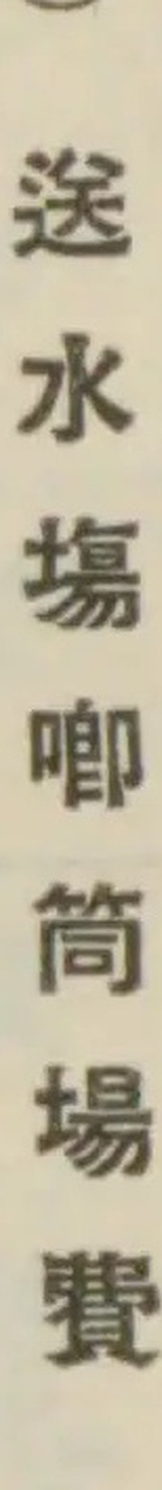(三)送水場喞筒場費
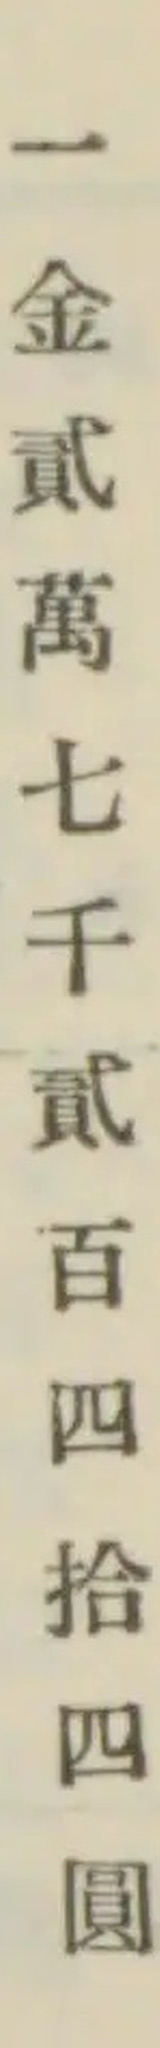一金貳萬七千貳百四拾四圓
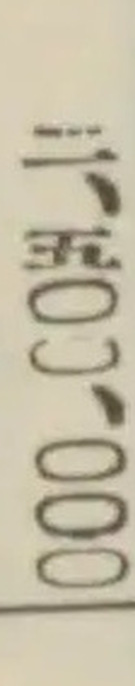変壓機六〇〇、〇〇〇
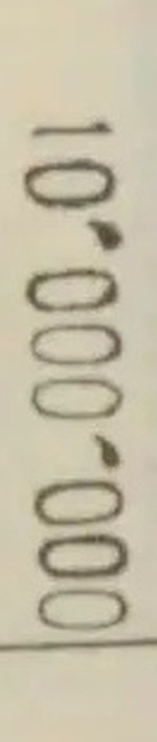変壓機六〇〇、〇〇〇
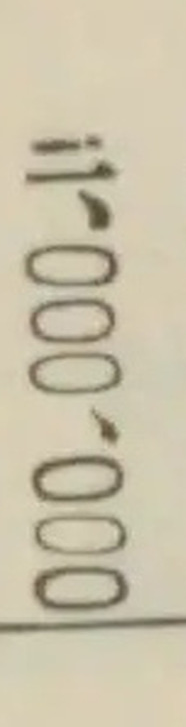変壓機六〇〇、〇〇〇
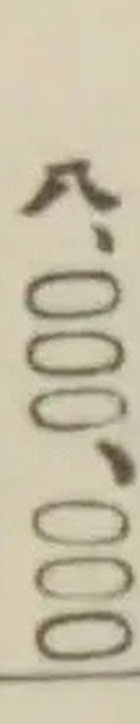変壓機六〇〇、〇〇〇
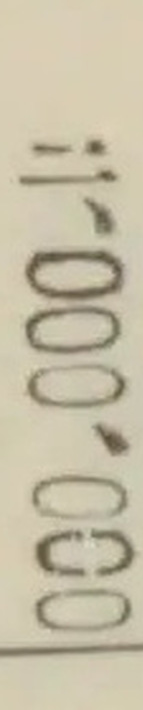変壓機六〇〇、〇〇〇
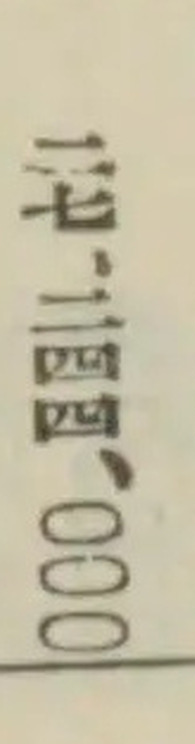計二七、二四四、〇〇〇
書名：豊橋市水道誌
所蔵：国立国会図書館 National Diet Library, JAPAN
